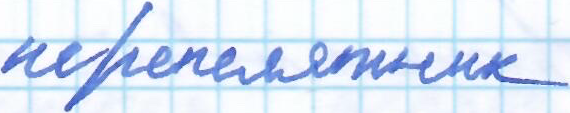перепелятник
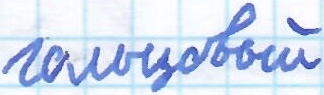гольцовый
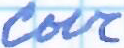сыч
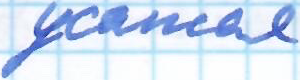усатая
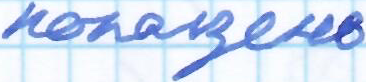поползень
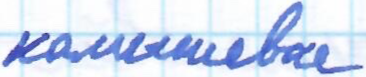камышевка
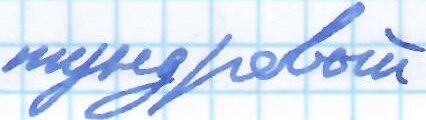тундровый
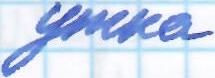утка
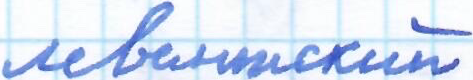левантский
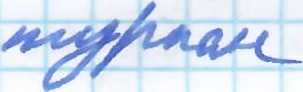турпан
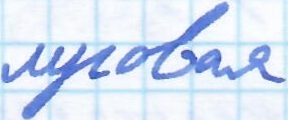луговая
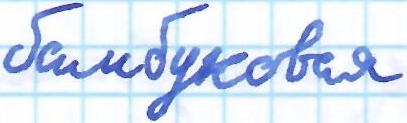бамбуковая
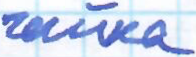чайка
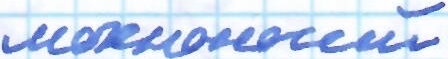мохноногий
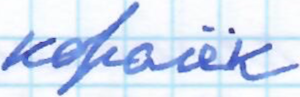королёк
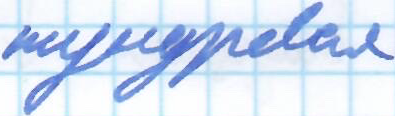тундровая
